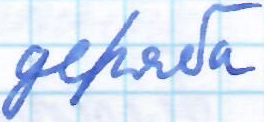деряба
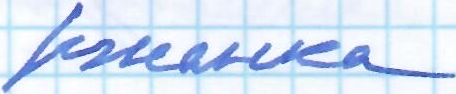ржанка
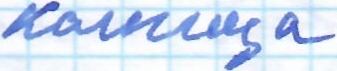колпица
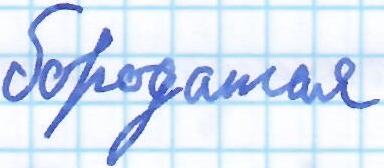бородатая
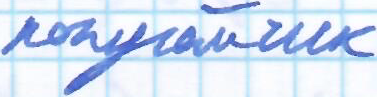попугайчик
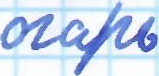огарь
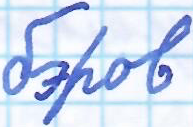бэров
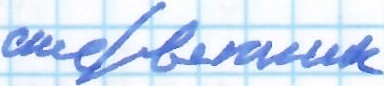стервятник
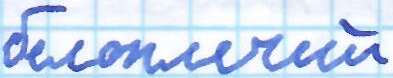белоплечий
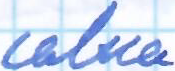савка
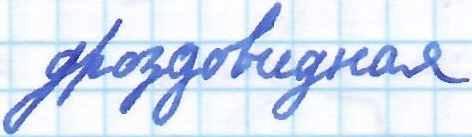дроздовидная
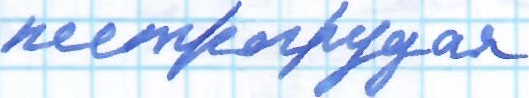пестрогрудая
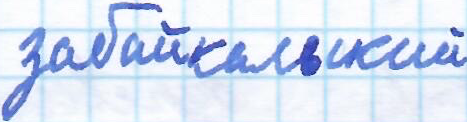забайкальский
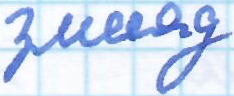змееяд
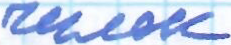чеглок
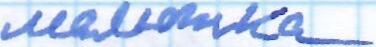малютка
